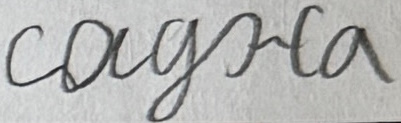саджа
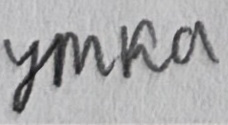утка
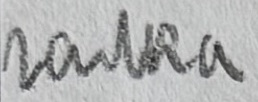галка
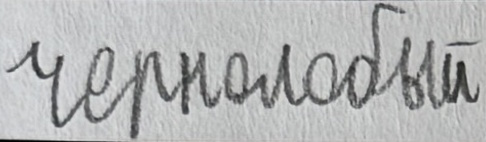чернолобый
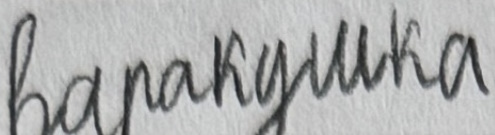варакушка
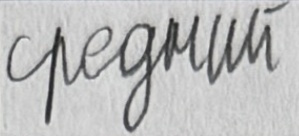средний
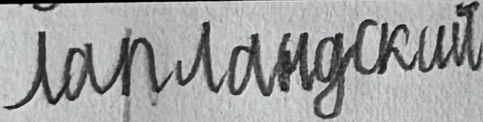лапландский
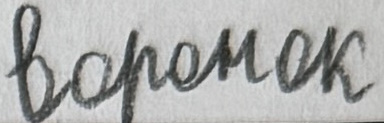воронок
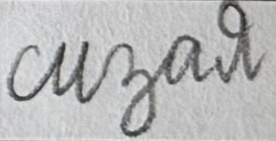сизая
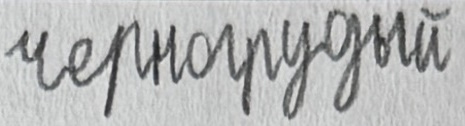черногрудый
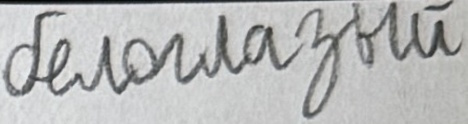белоглазый
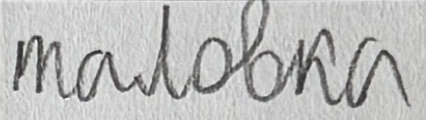таловка
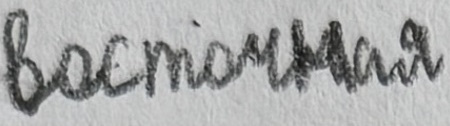восточная
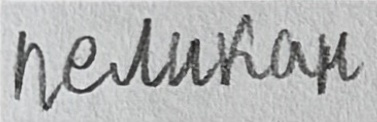пеликан
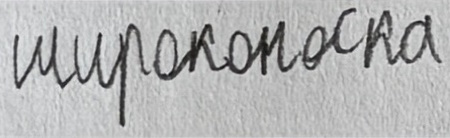широконоска
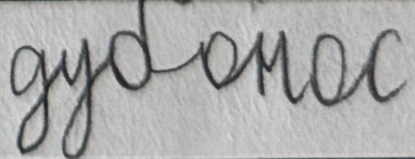дубонос
